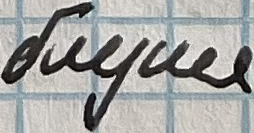бледная
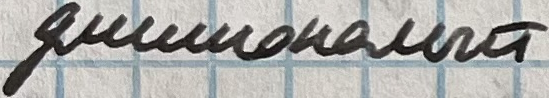длиннопалый
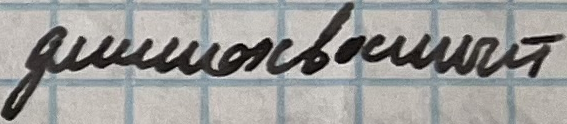длиннохвостый
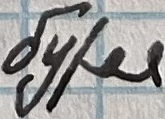бурая
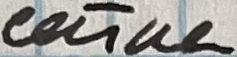сойка
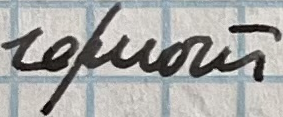горный
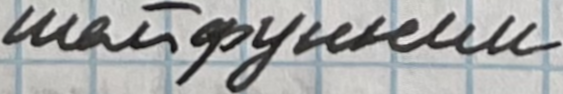тайфунник
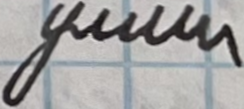улит
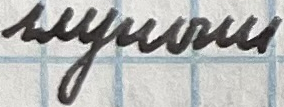глупыш
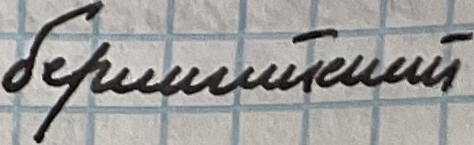берингийский
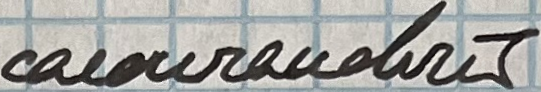солончаковый
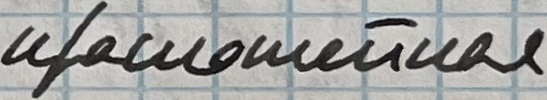красношейная
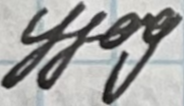удод
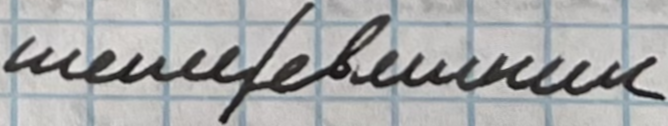тетеревятник
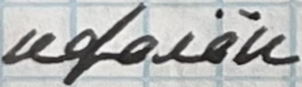королёк
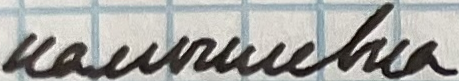камышевка
